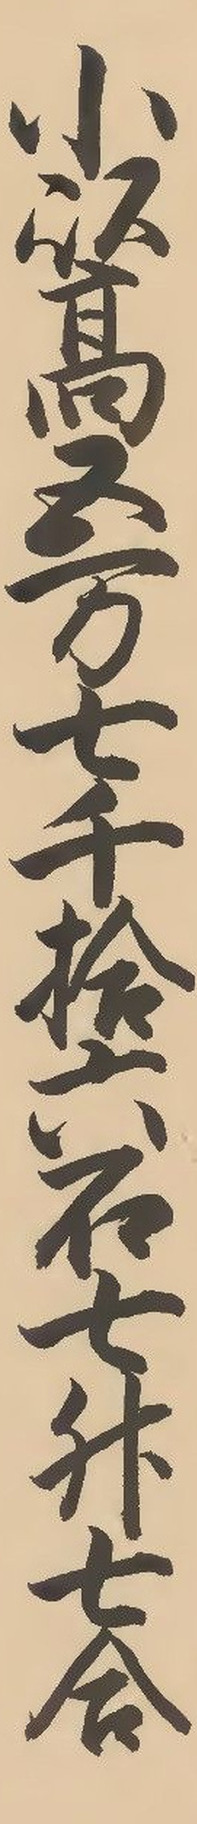小以髙五万七千拾六石七升七合
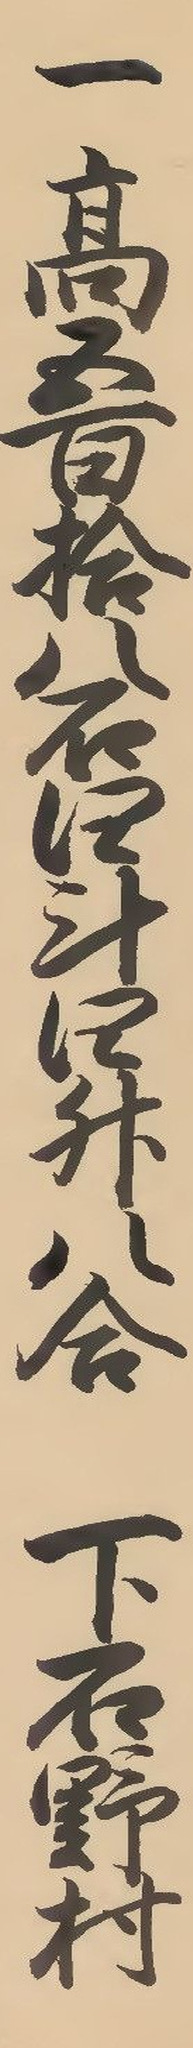一髙五百拾八石四斗四升八合下石野村
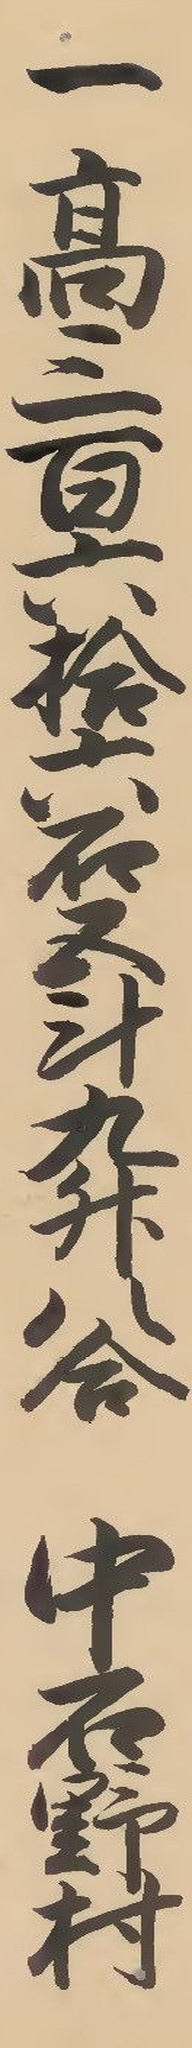一髙三百六拾六石五斗九升八合中石野村
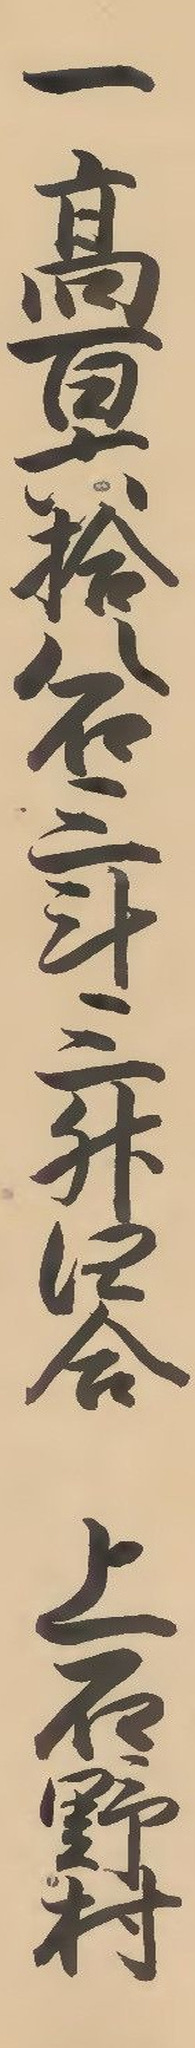一髙百六拾八石三斗三升四合上石野村

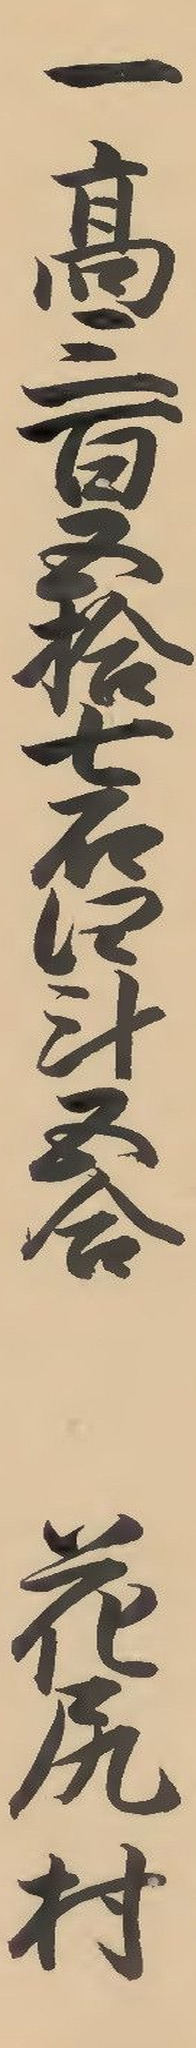一髙三百五拾七石四斗五合花尻村
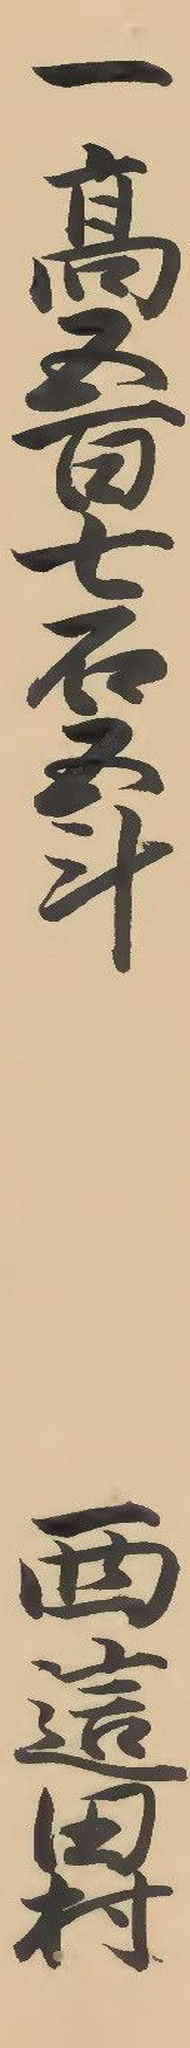一髙五百七石五斗西這田村
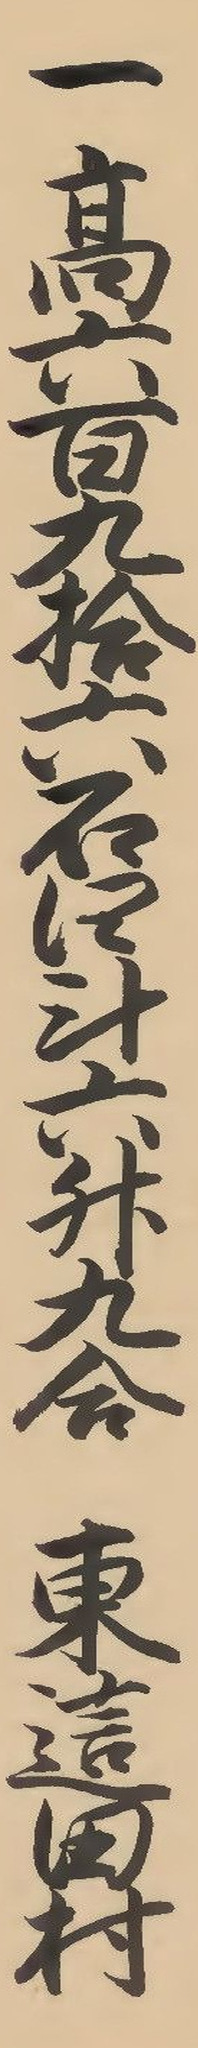一髙六百九拾六石四斗六升九合東這田村
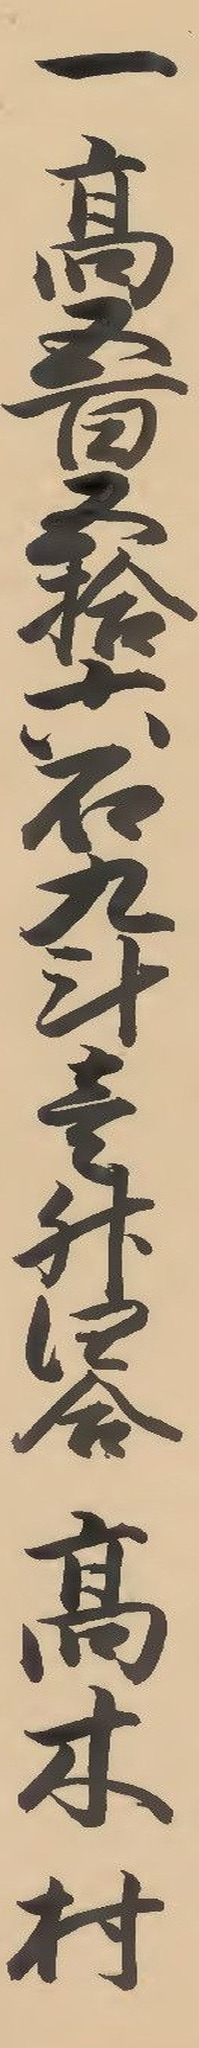一髙五百五拾六石九斗壱升四合髙木村
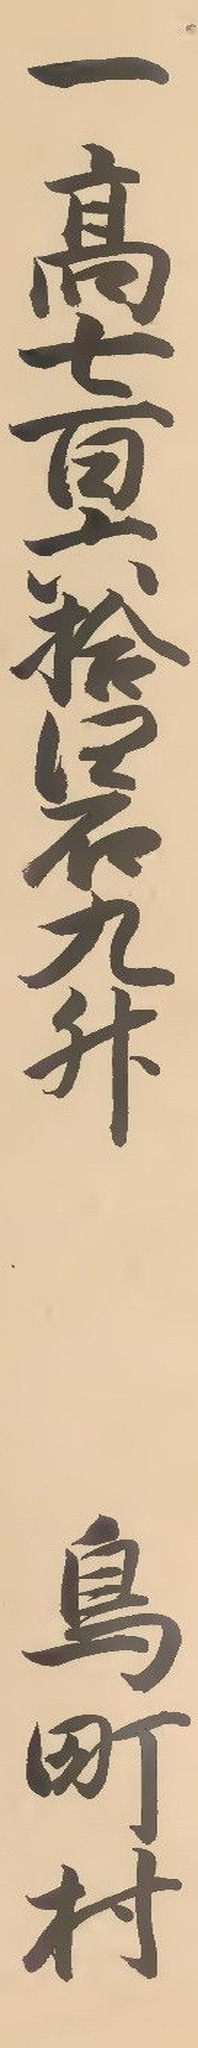一髙七百六拾四石九升鳥町村
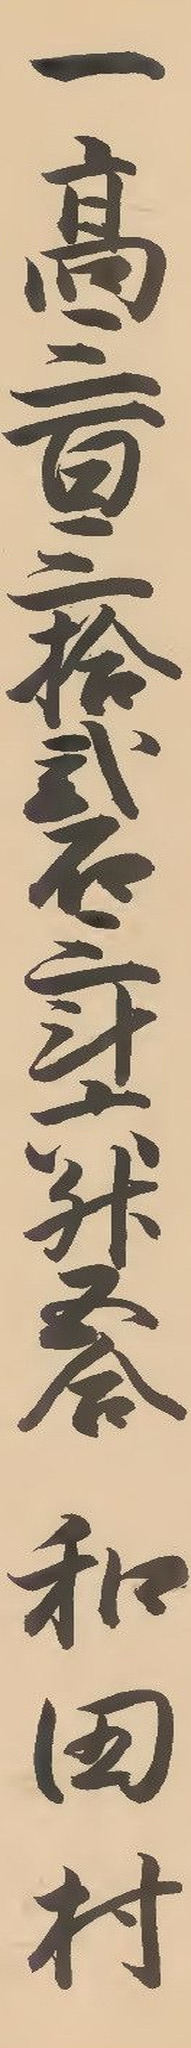一髙三百三拾弐石三斗六升五合和田村
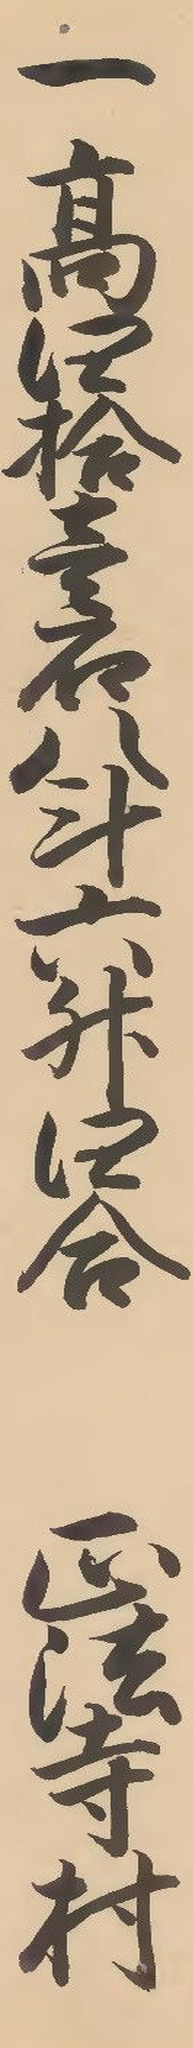一髙四拾壱石八斗六升四合正法寺村
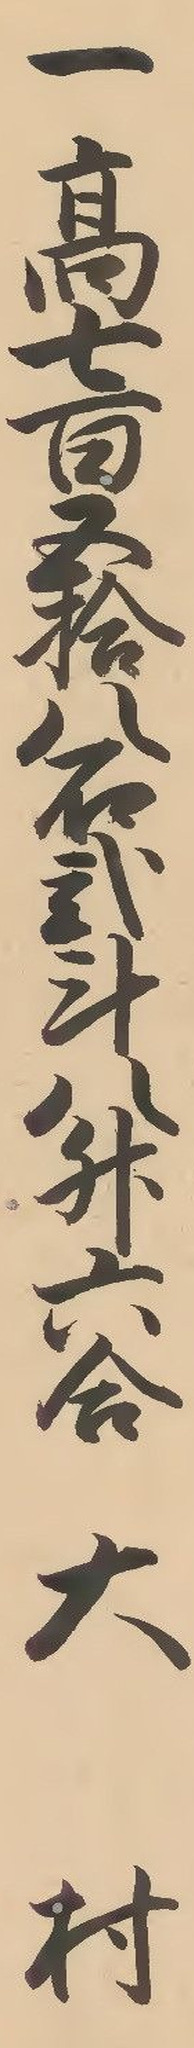一髙七百五拾八石弐斗八升六合大村

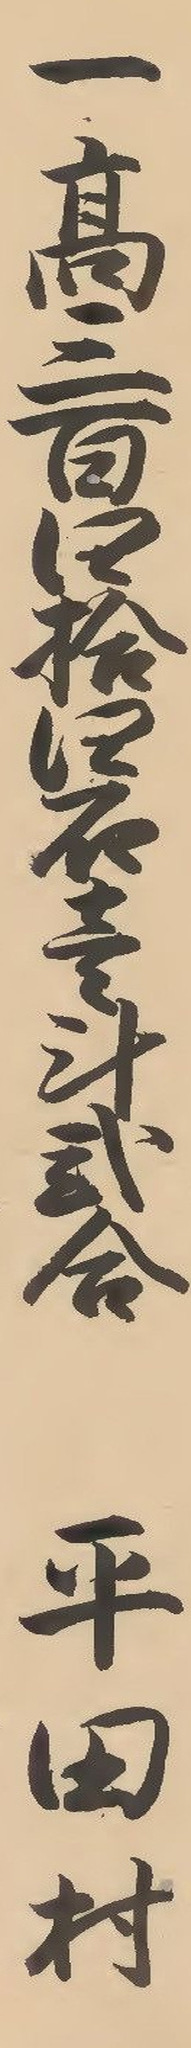一髙三百四拾四石壱斗弐合平田村
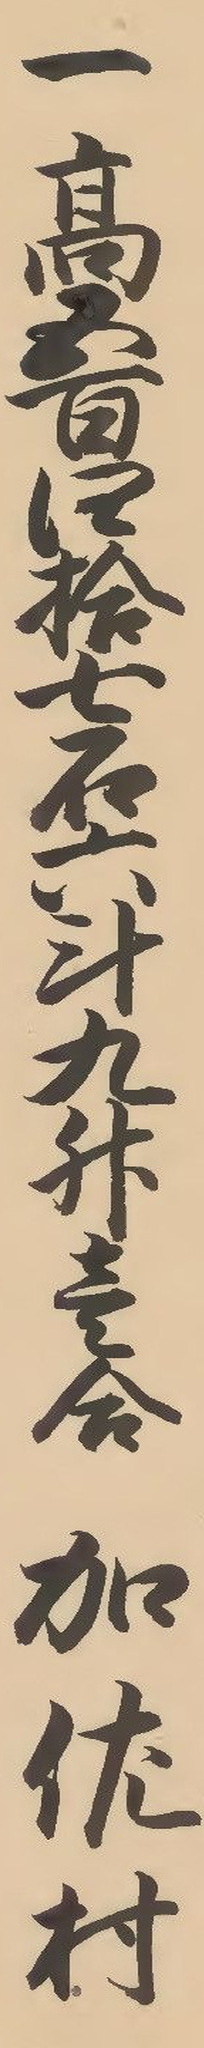一髙五百四拾七石六斗九升壱合加佐村
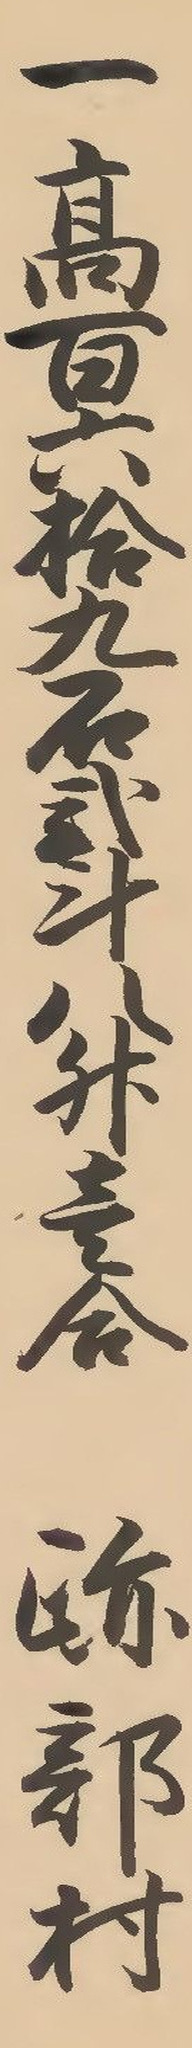一髙百六拾九石弐斗八升壱合跡部村
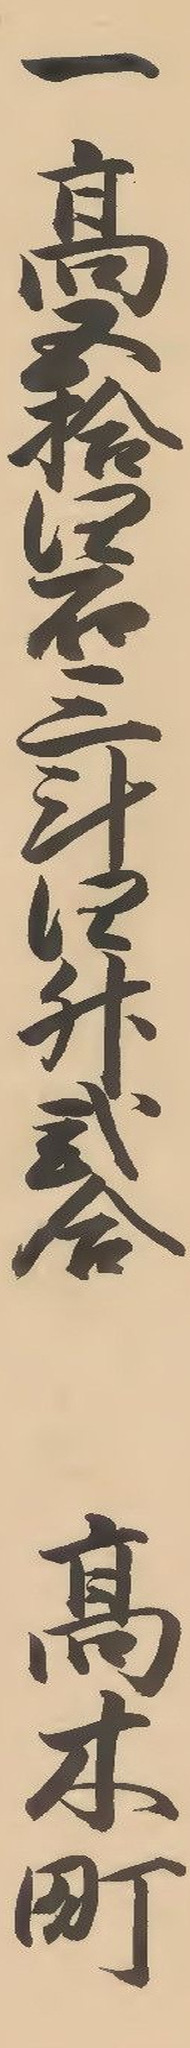一髙五拾四石三斗四升弐合髙木町
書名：播磨国郷帳
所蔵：国立公文書館 National Archives of Japan
